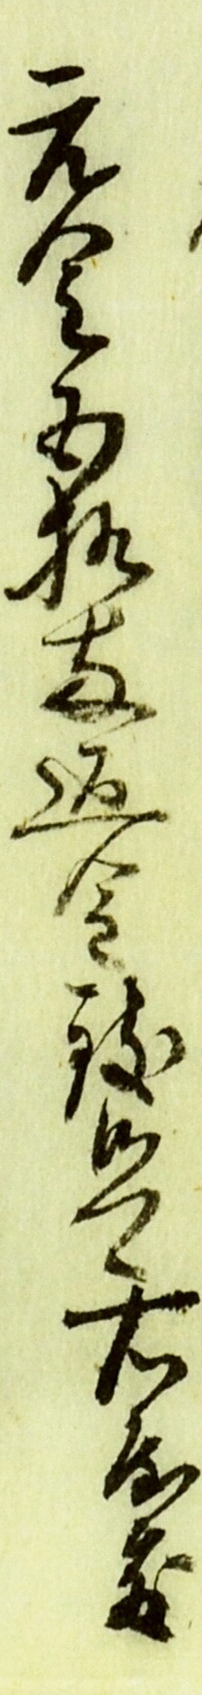元金五拾両返金候ハヽ右屋敷
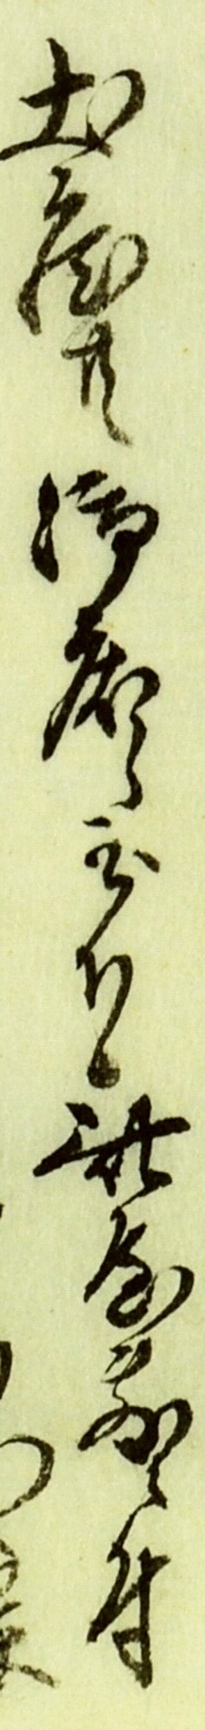土蔵共御戻し被下候此度屋敷ニ付
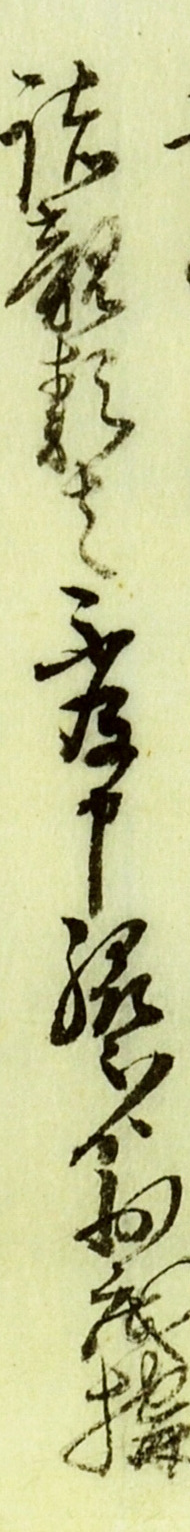諸親類者不及申脇々ゟ少茂構
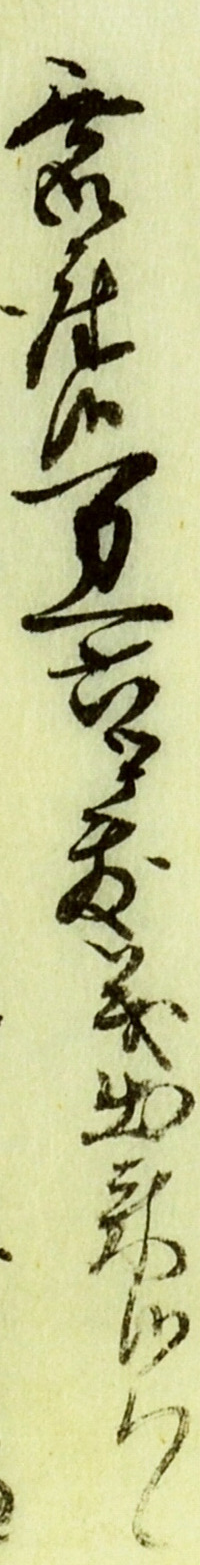無御座候万一六ツケ敷義出来候ハヽ
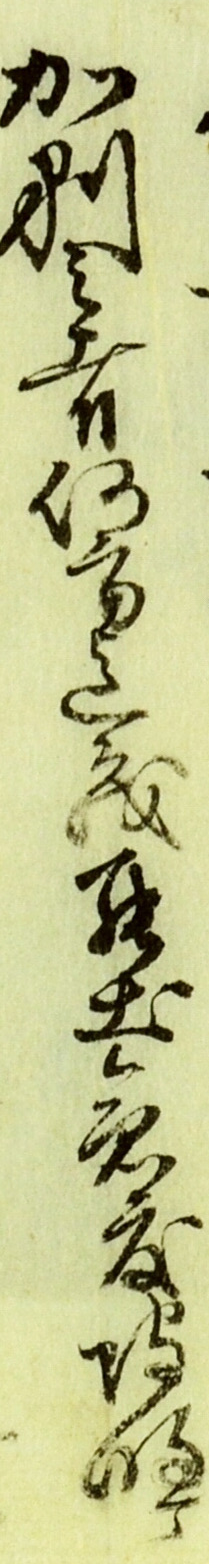加判之者何方迄茂罷出急度埒明ケ
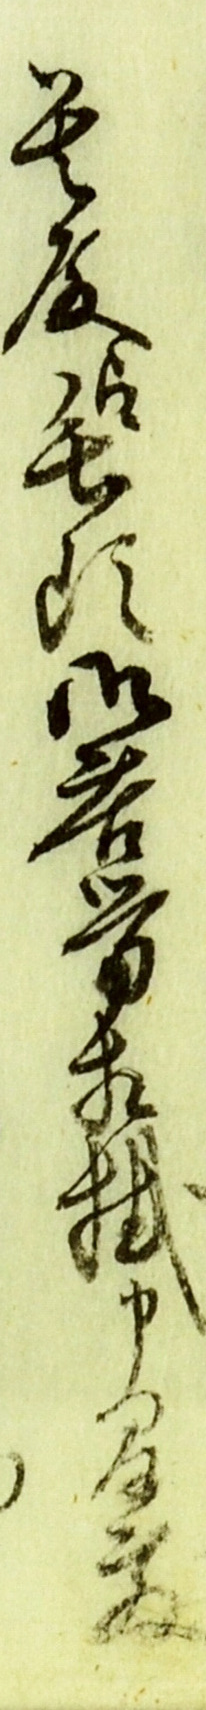貴殿江毛頭御苦労相掛申間敷
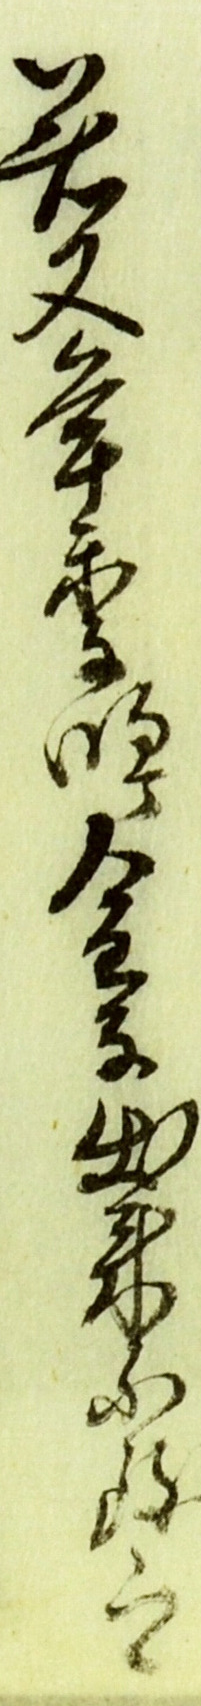若又年季明ケ金子出来不致候ハヽ
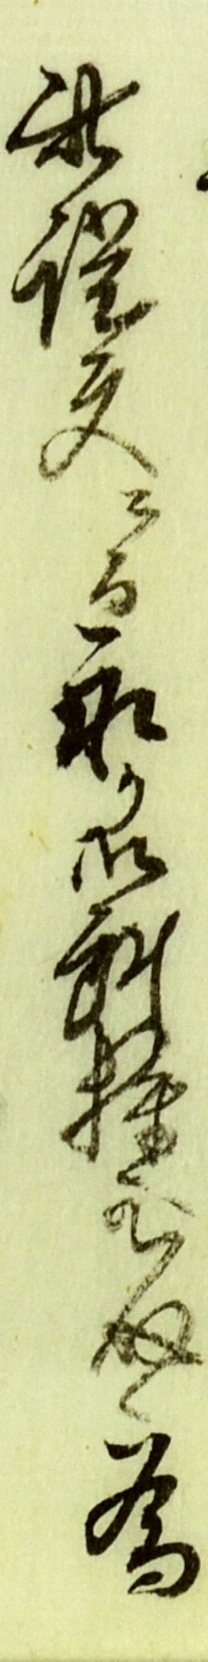此証文二而永ク御所持被成候為
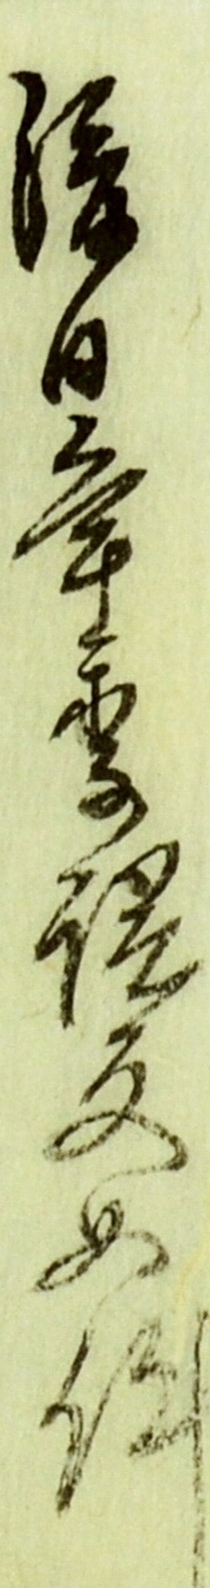後日年季証文如件

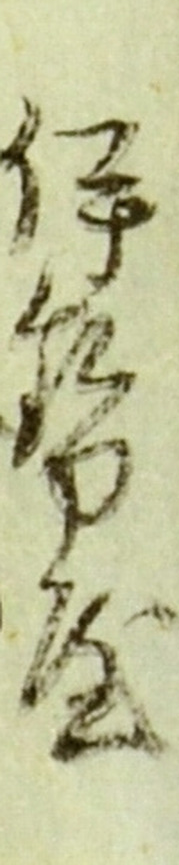伊勢屋
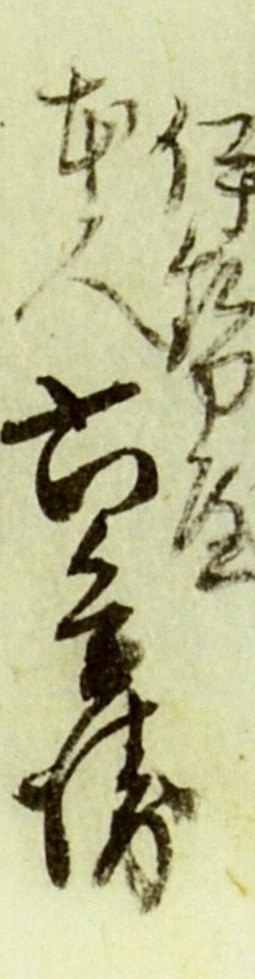本人六兵衛
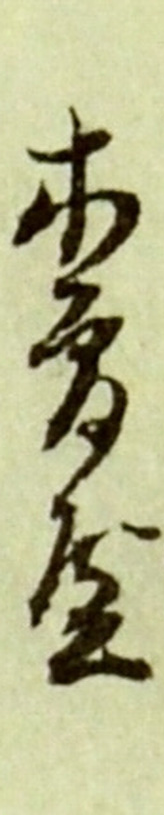木曽屋
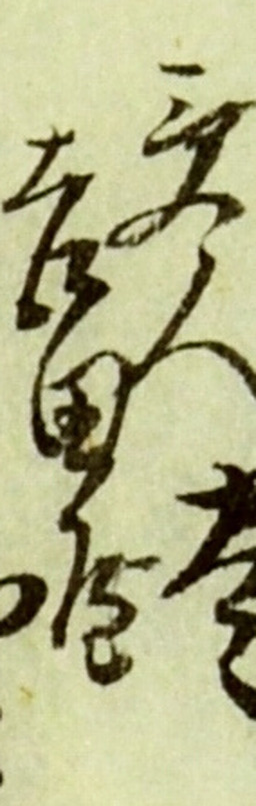吉田屋
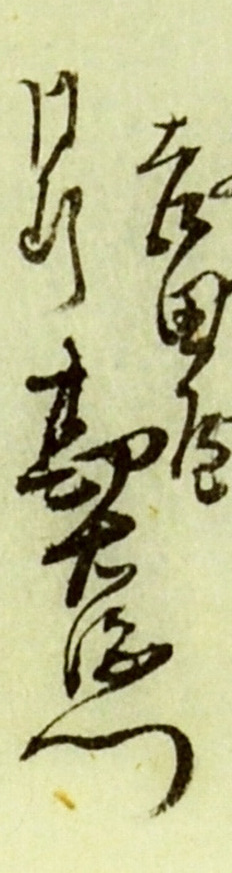同断勘右衛門
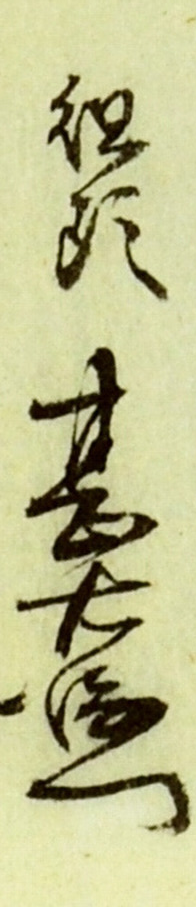組頭甚右衛門
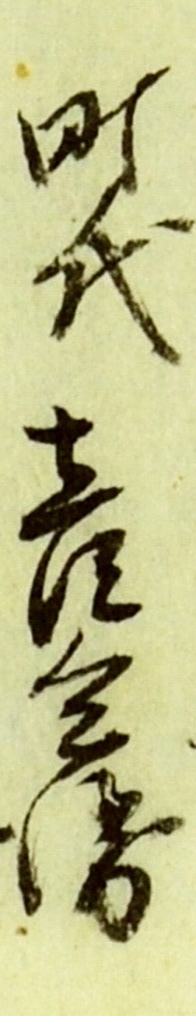町代彦兵衛
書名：造酒株一件始末
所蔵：伊那市立高遠町図書館・合同会社AMANE
